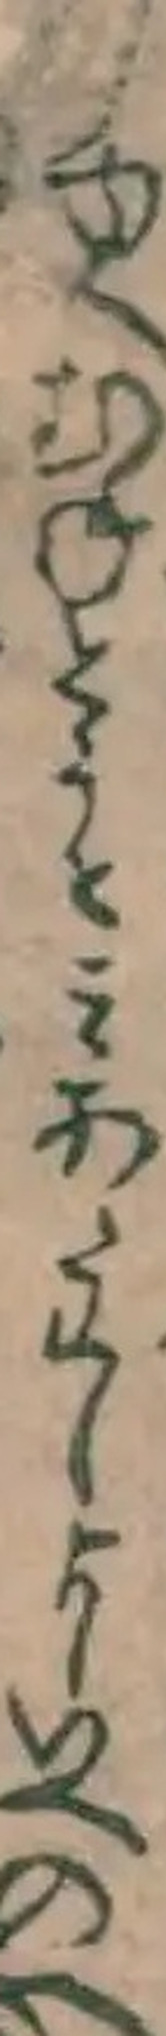しゆへむねとうとみあらわしよしいへの
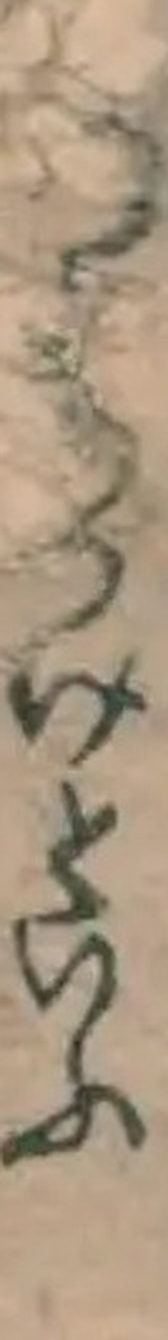ばつかにつけといふ
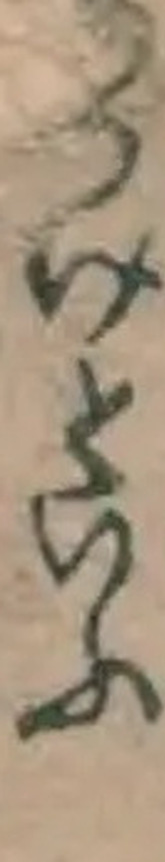せしといふ
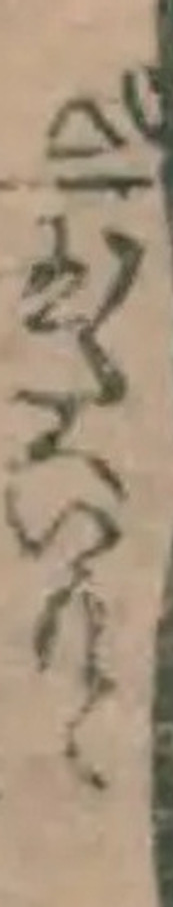国たへいもと
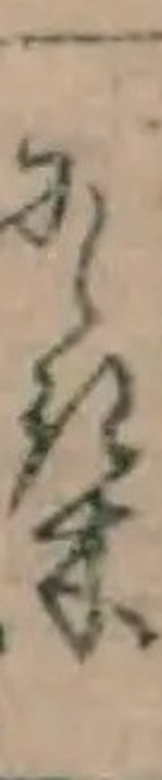にしき木
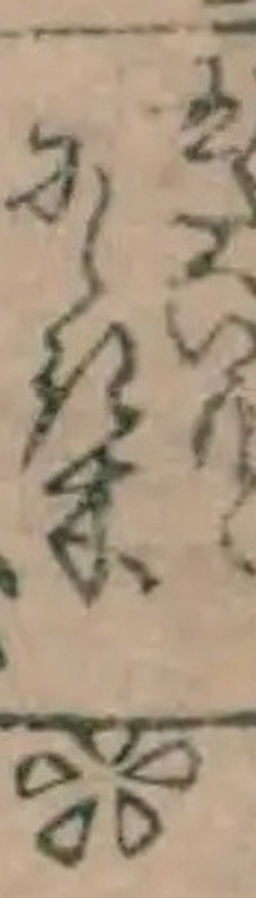にしき木
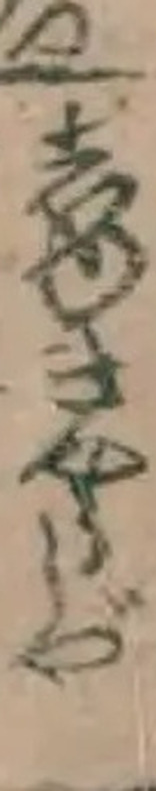しゆきやうじや
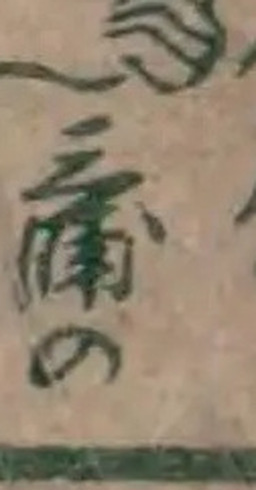三浦の
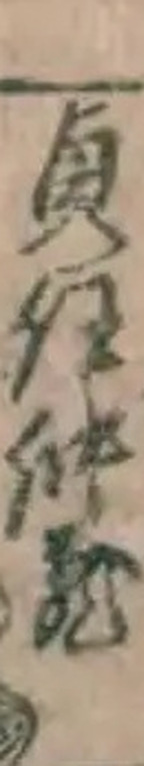貞任仲蔵
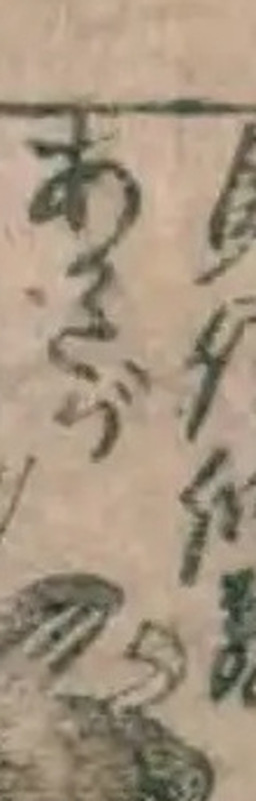あかたが
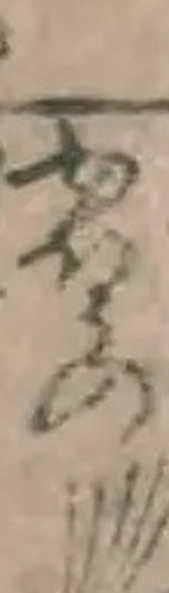女ほうの
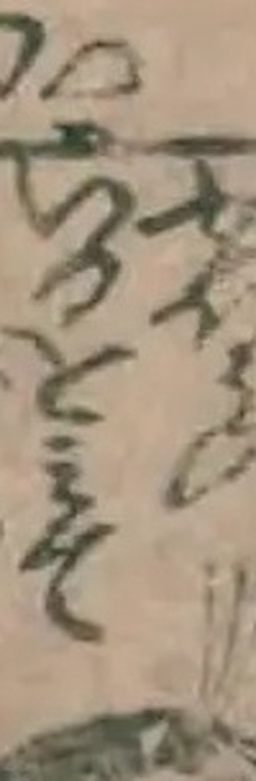いるをみて
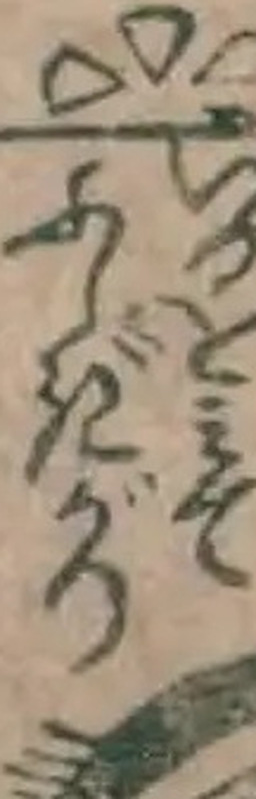ふしぎがり
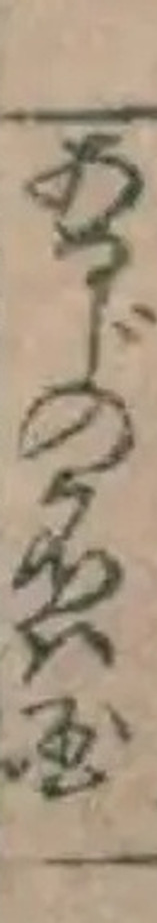あるじの名は国
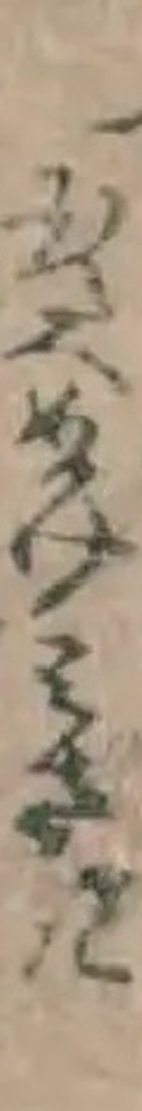国たへめかけみさき
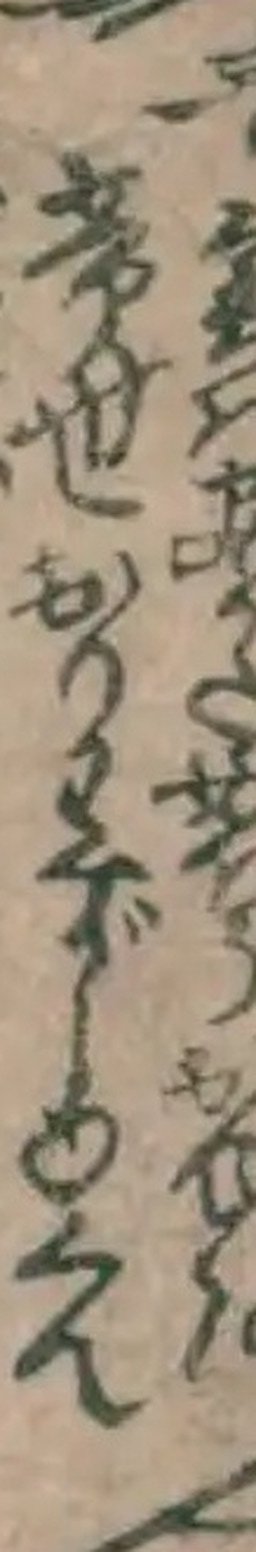常世おもわずしゆくん
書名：伊達錦對将 : 森田座
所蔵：国立国会図書館 National Diet Library, JAPAN
